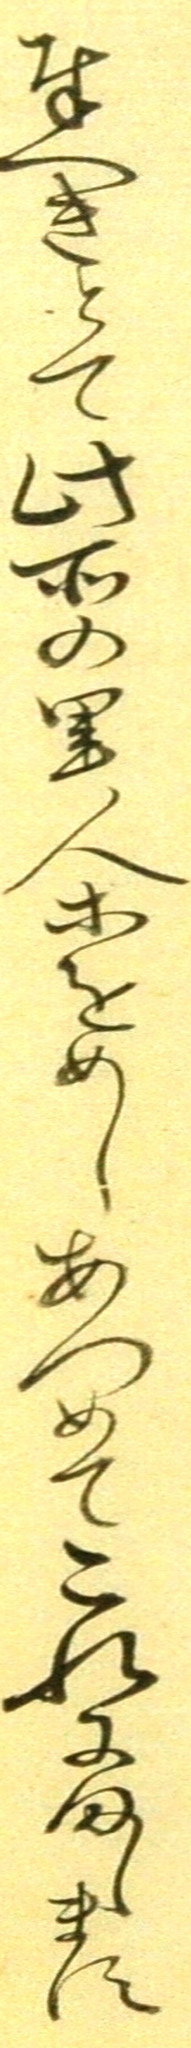奉へきとて此所の里人等をめしあつめてこれにまします
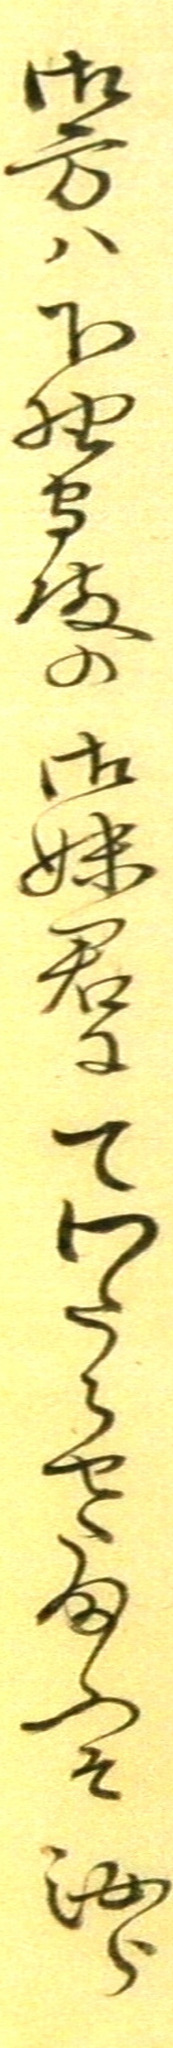御方は下野守殿の御妹君にてわたらせたまふそ汝ら

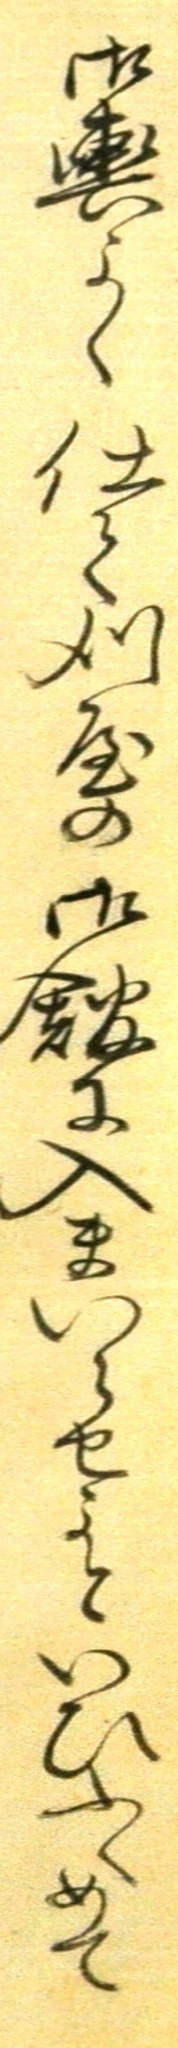御輿よく仕て刈屋の御館に入まいらせよといひふくめて
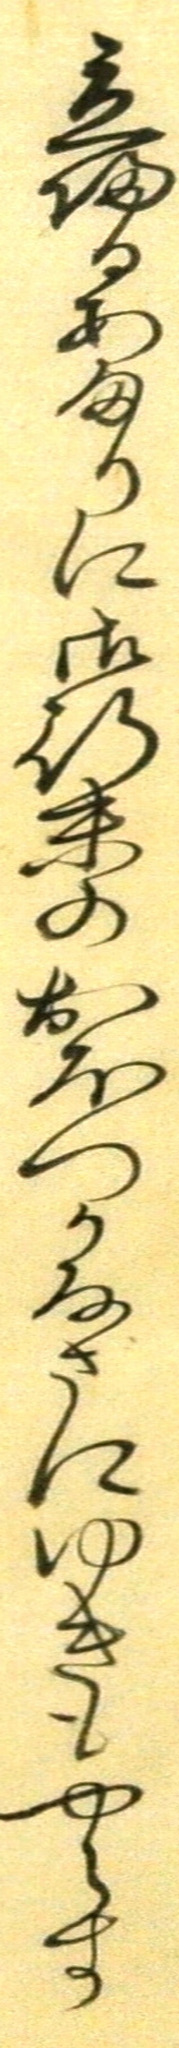立帰るあまりに御行末のおほつかなさにゆきもやらす
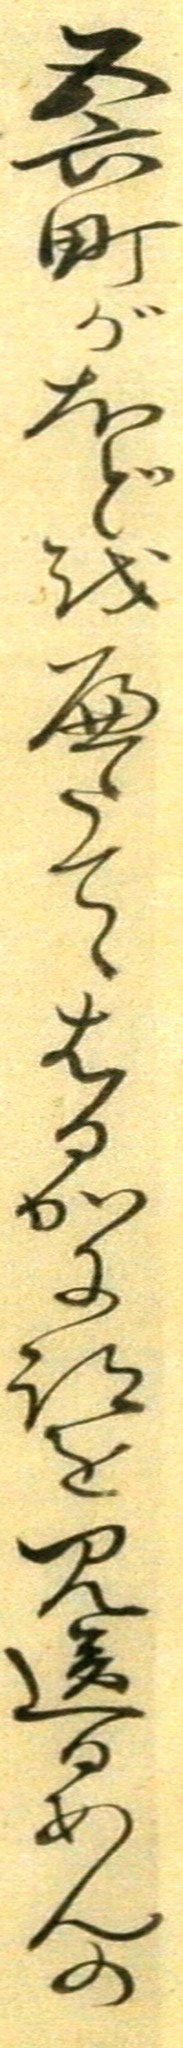五六町がほどをへたてゝはるかに跡を見送るあんの
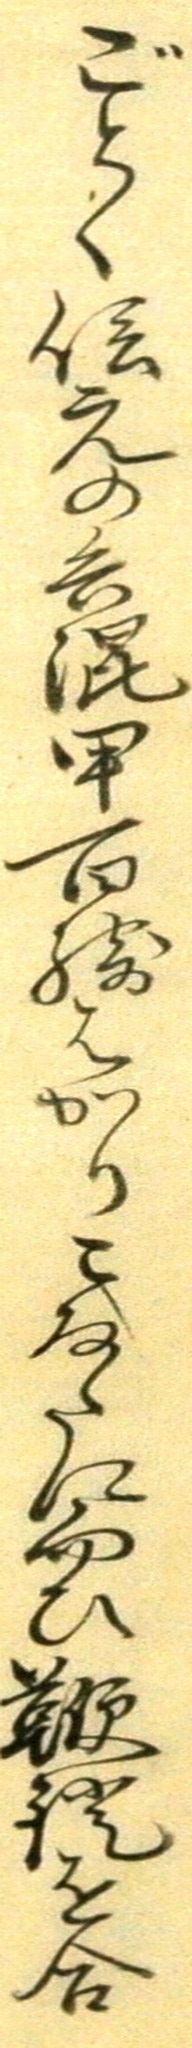ごとく信光の兵混甲百騎はかりこなたに向ひ鞭鐙を合
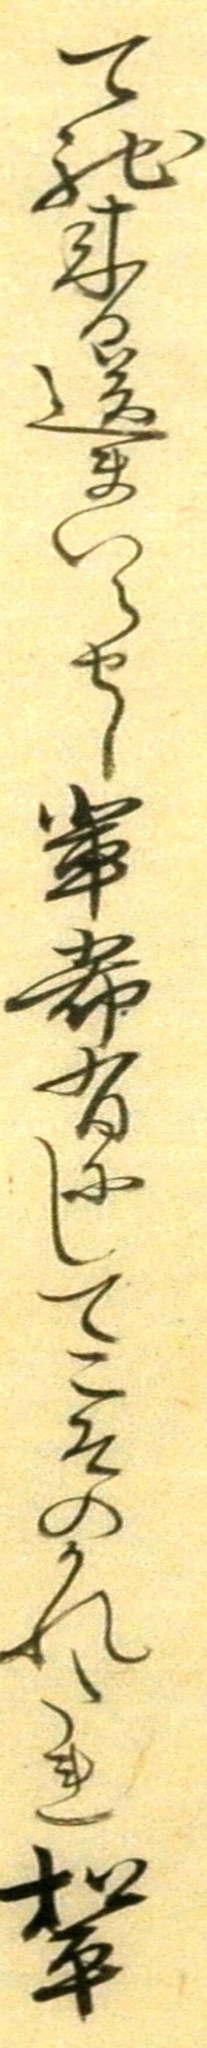て馳来る送まいらせし輩希有にしてこそのかれたれ松平
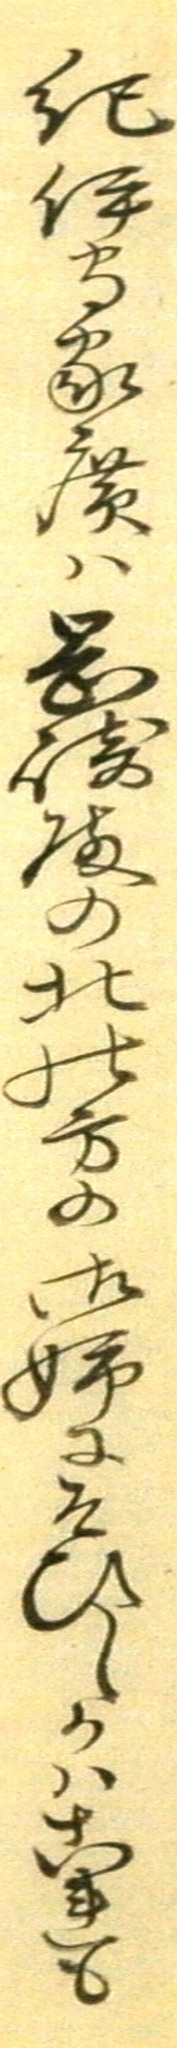紀伊守家広は岡崎殿の北の方の御姉にそひしかはこれも
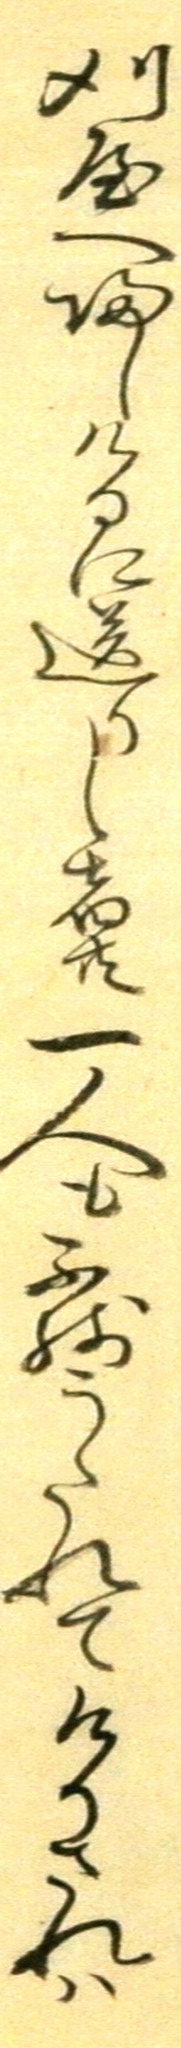刈屋へ帰しけるに送りし者共一人も不残うたれてけりされは
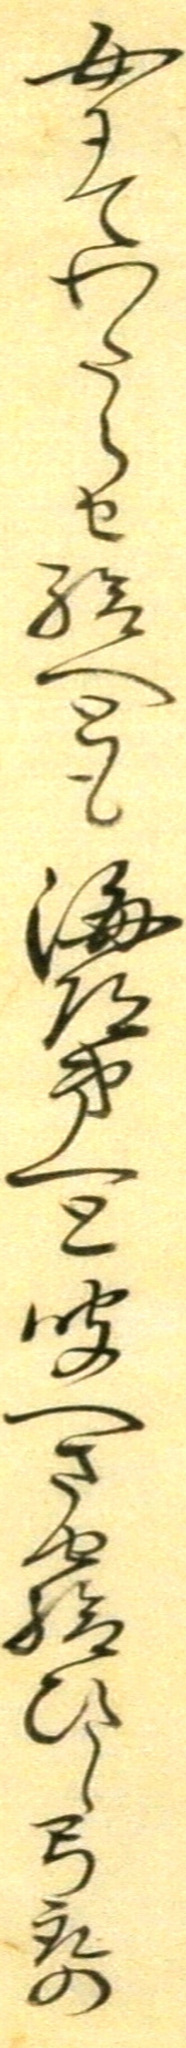女にてわたらせ給へとも海道第一と聞へさせ給ひし弓取の
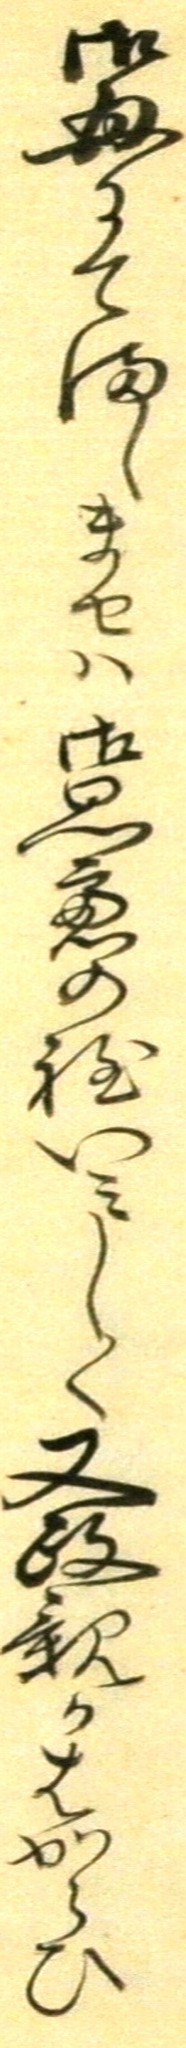御母にてましませは御思慮の程いみしく又政親かはからひ
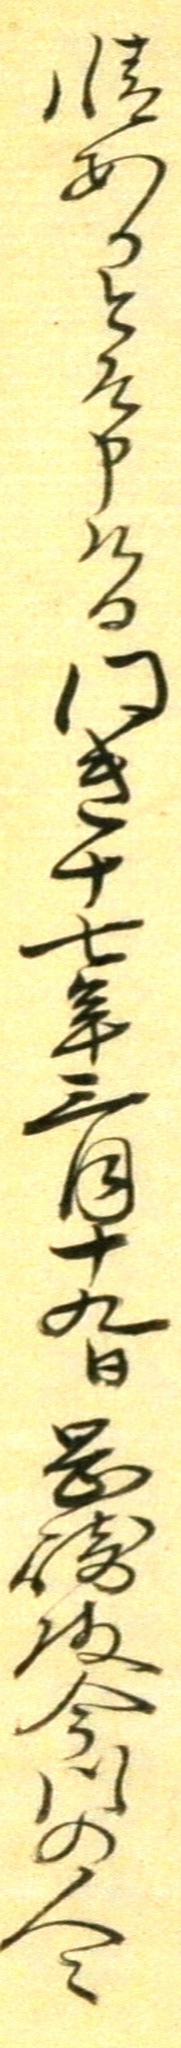情ありとそ申ける同き七年三月十九日岡崎殿今川の人々
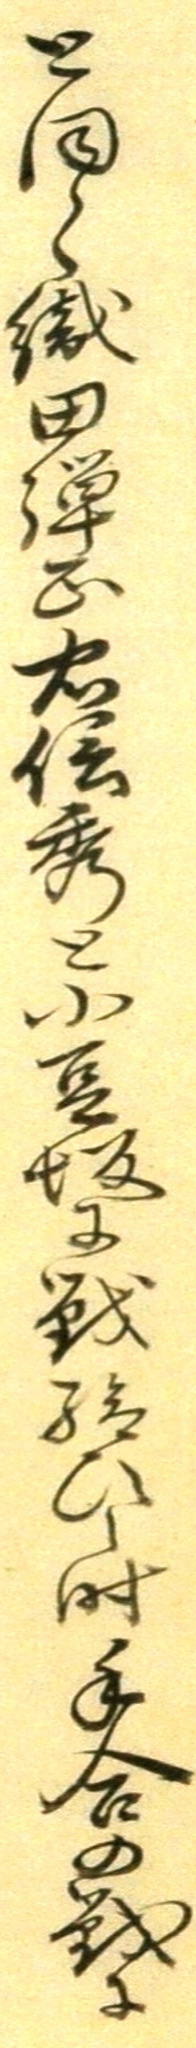と同く織田弾正忠信秀と小豆坂に戦給ひし時手合の戦に
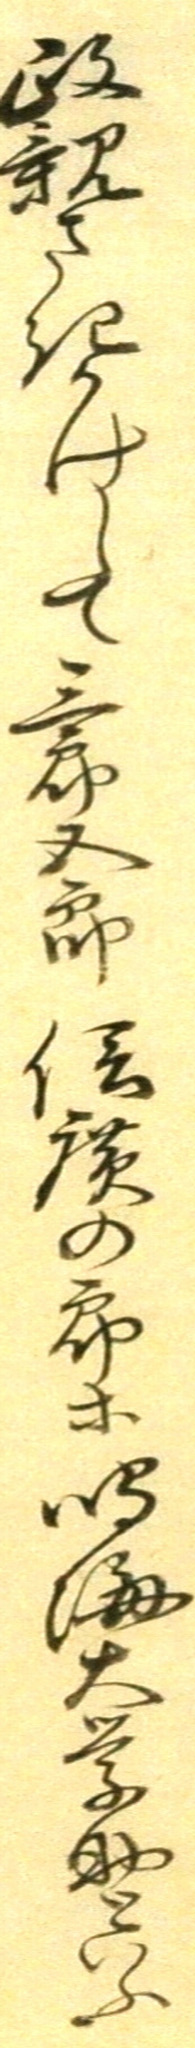政親さきかけして三郎五郎信広の郎等鳴海大学助といふ
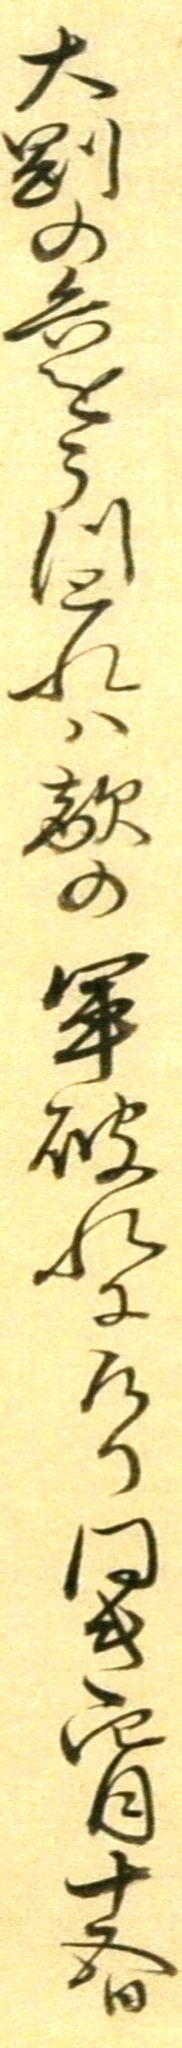大剛の兵をうつとれは敵の軍破れにけり同き四月十五日
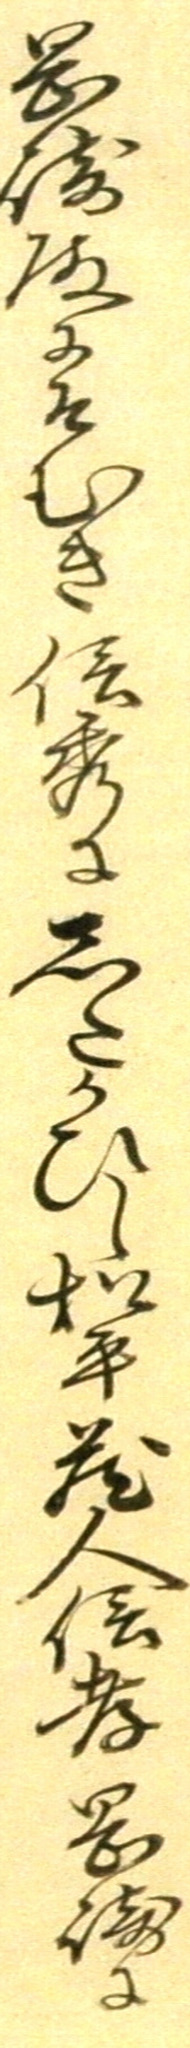岡崎殿にそむき信秀にしたかひし松平蔵人信孝岡崎に
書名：藩翰譜（五）
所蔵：伊那市立高遠町図書館・合同会社AMANE
